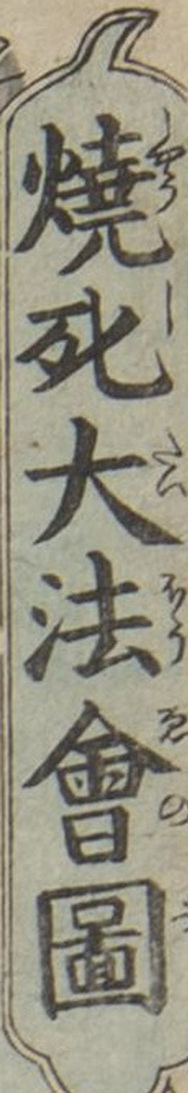焼死大法会図
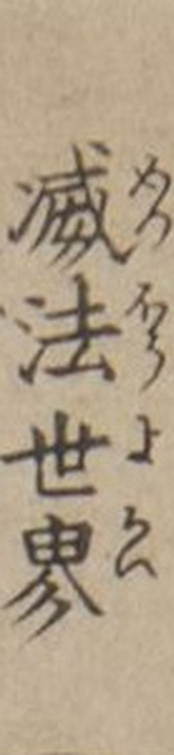滅法世界
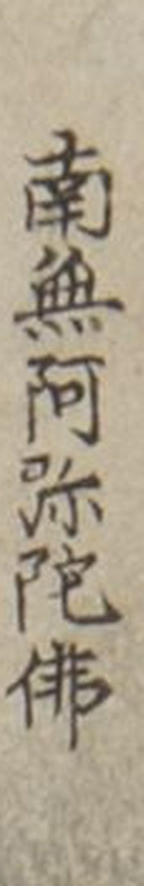南無阿弥陀佛
